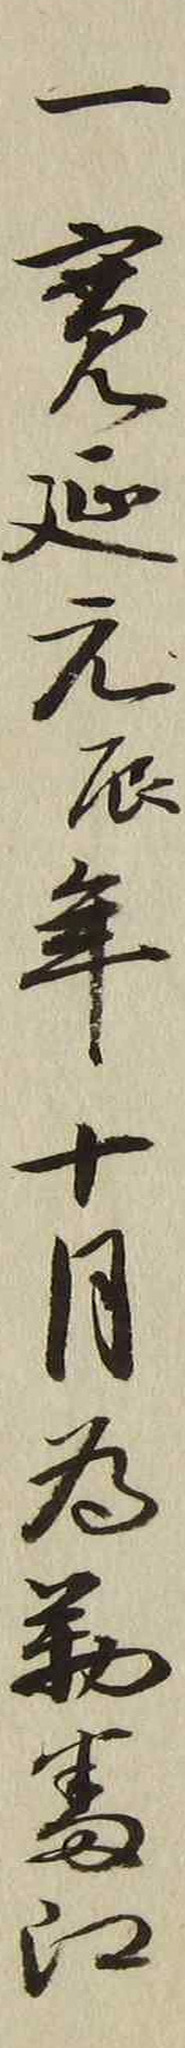一寛延元辰年十月為勤番江
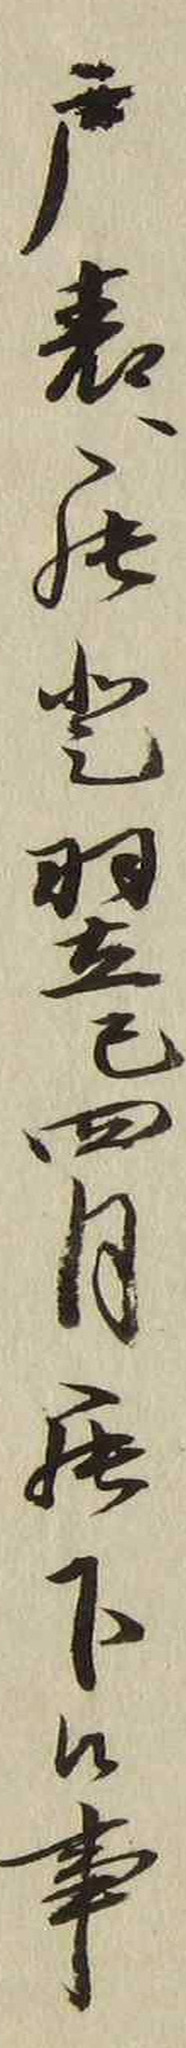戸表へ罷登翌巳四月罷下候事
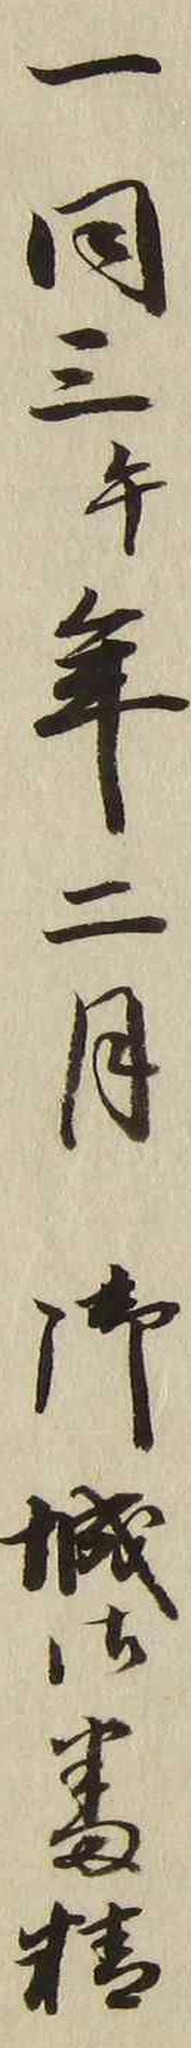一同三午年二月御城御番精

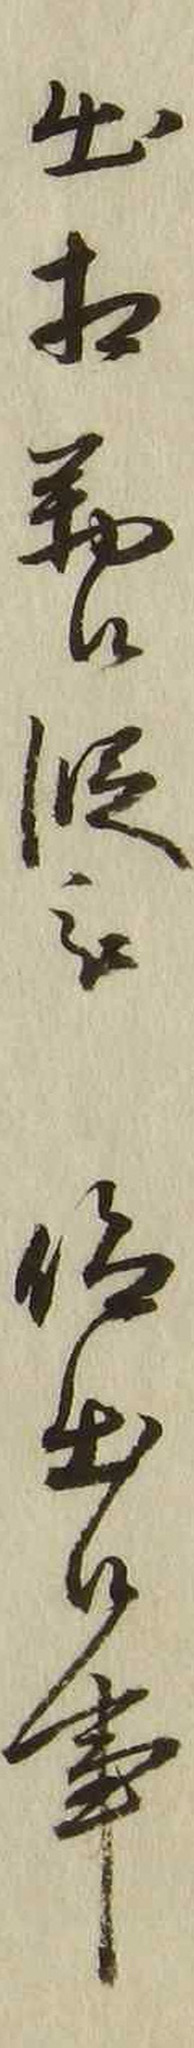出相勤候段被仰出候事
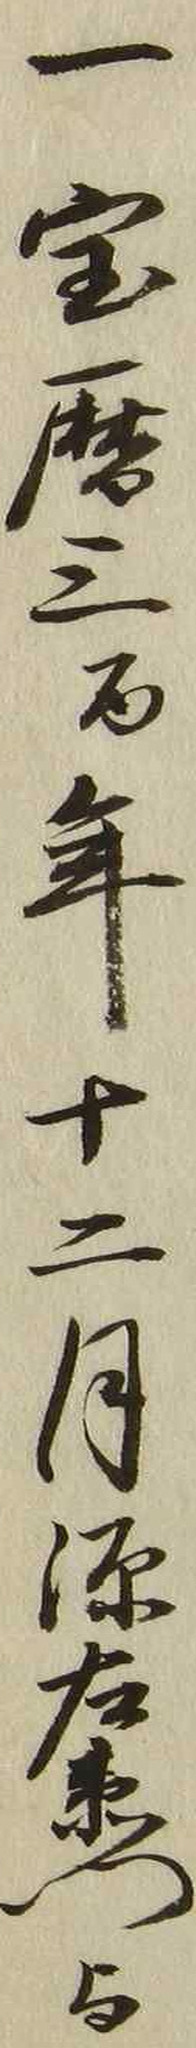一宝暦三酉年十二月源左衛門与
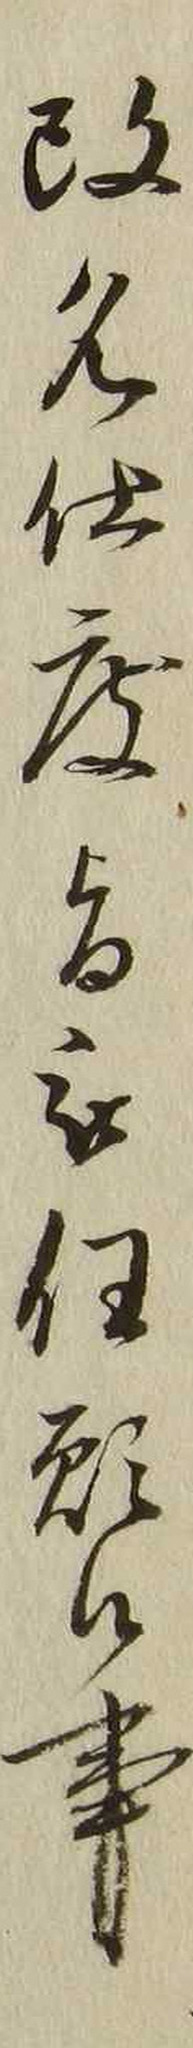改名仕度旨被任願候事
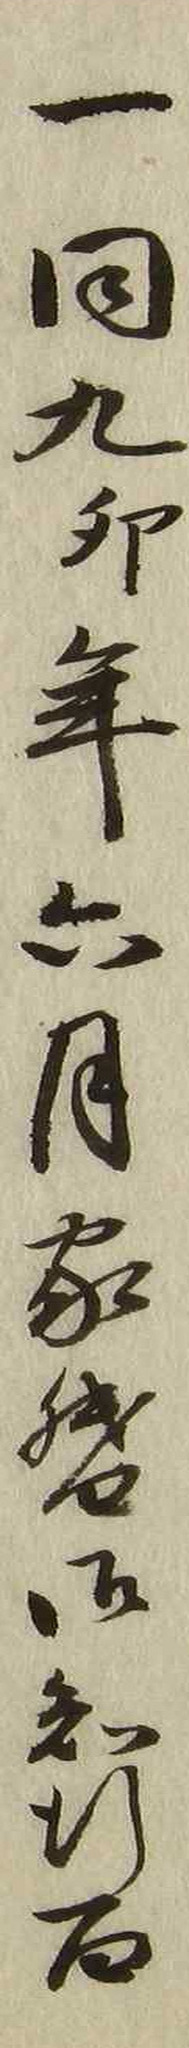一同九卯年六月家督御知行百
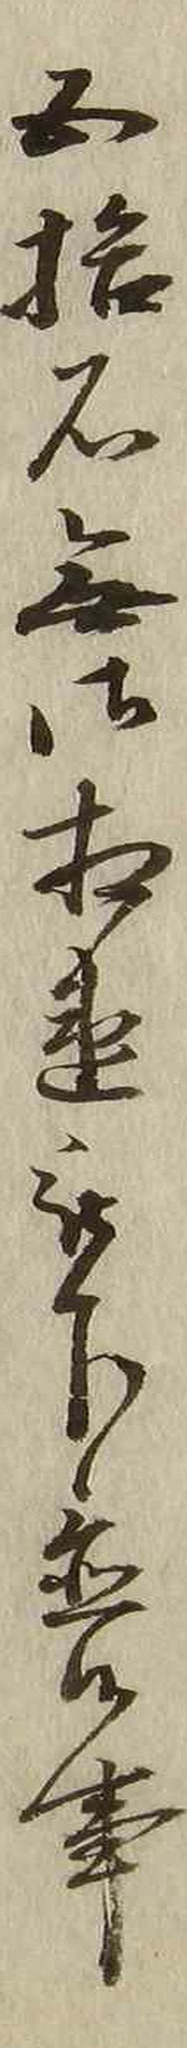五拾石無御相違被下置候事
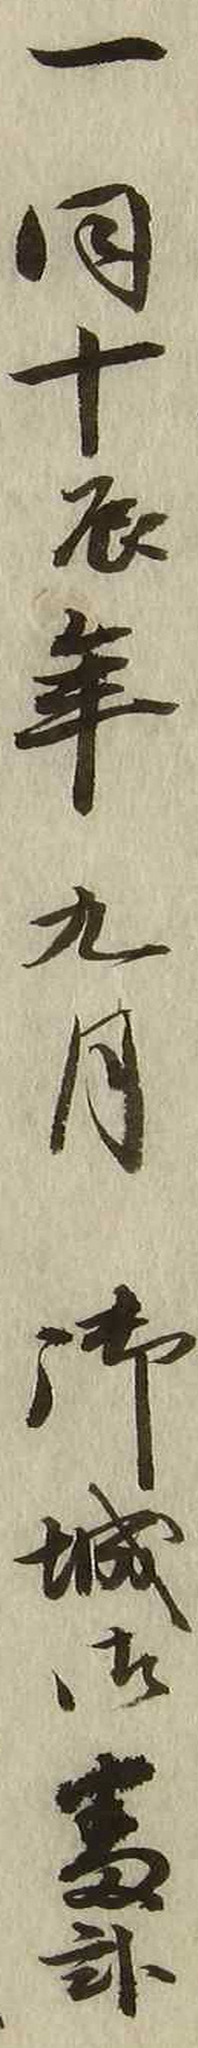一同十辰年九月御城御番弐
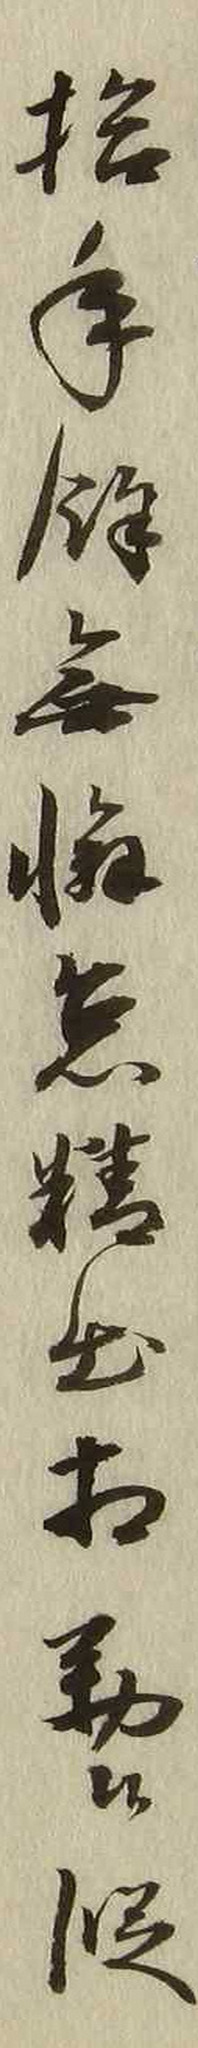拾年余無懈怠精出相勤候段
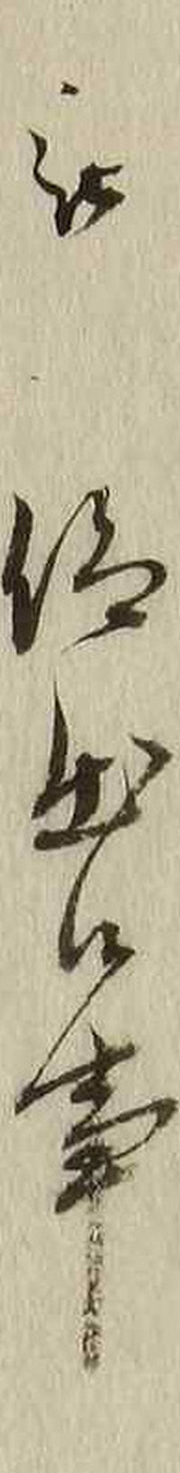被仰出候事
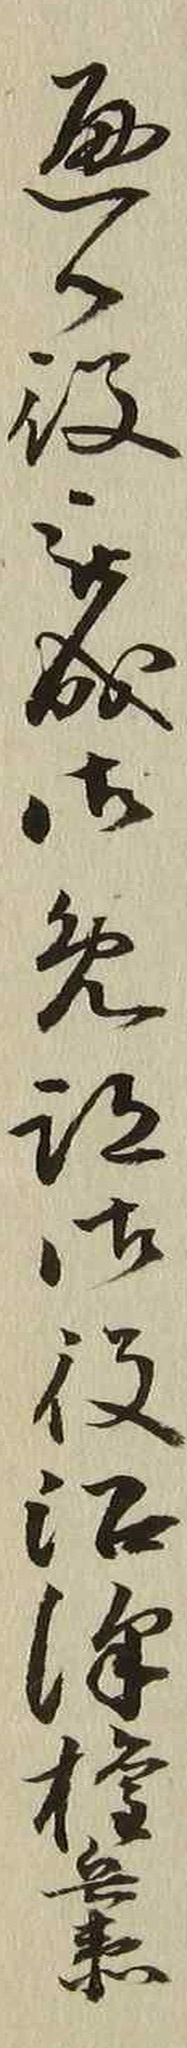通御役被成御免跡御役沼沢権兵衛
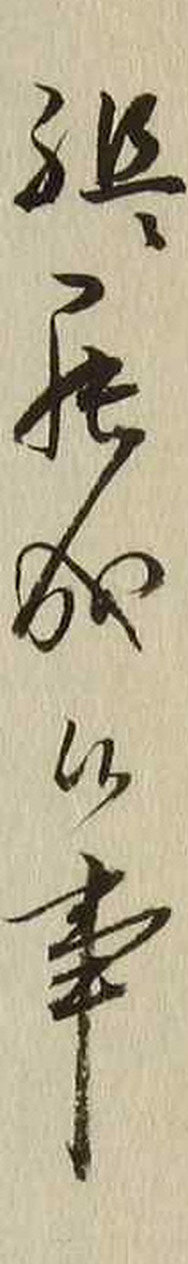組ニ罷成候事
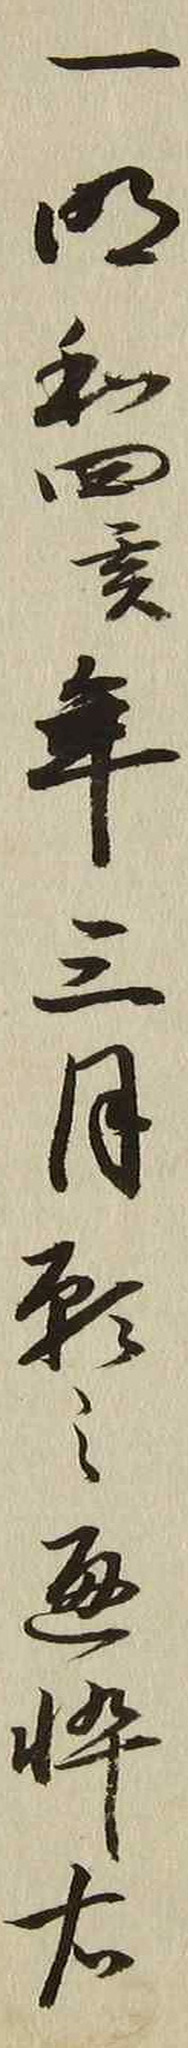一明和四亥年三月願之通忰右
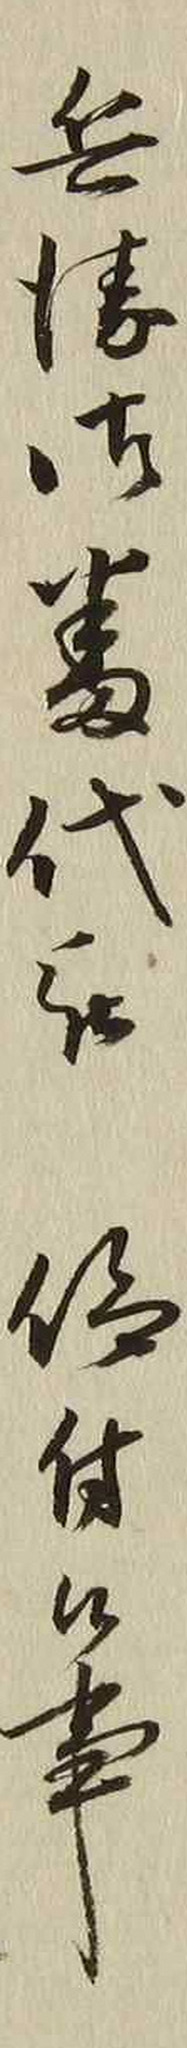兵衛御番代被仰付候事
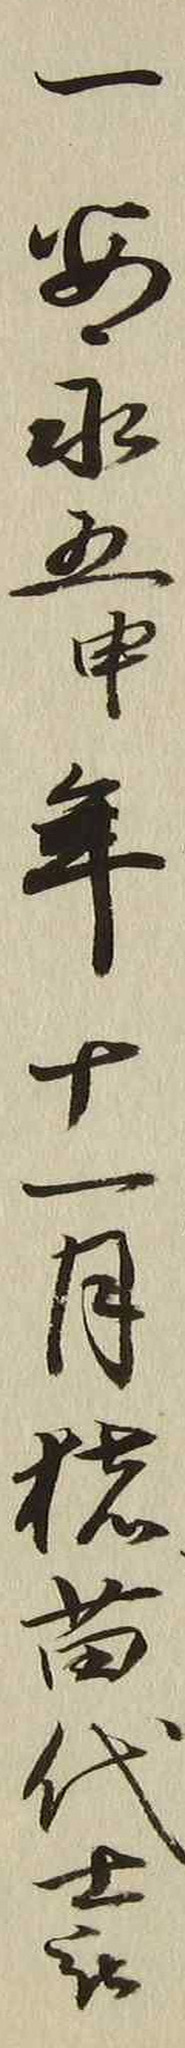一安永五申年十一月猪苗代士被
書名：諸士系譜　巻之61　と之部4
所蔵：会津若松市立会津図書館
